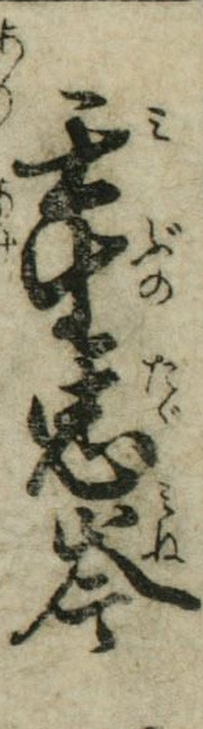壬生忠岑
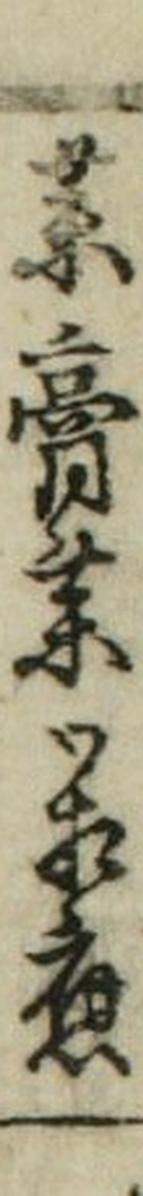薬膏薬御相応
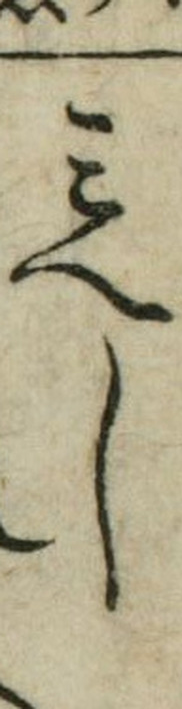みへし
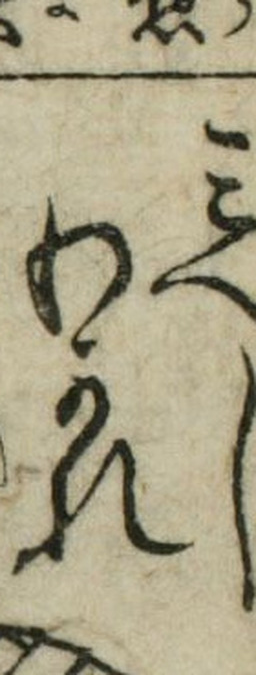わかれ
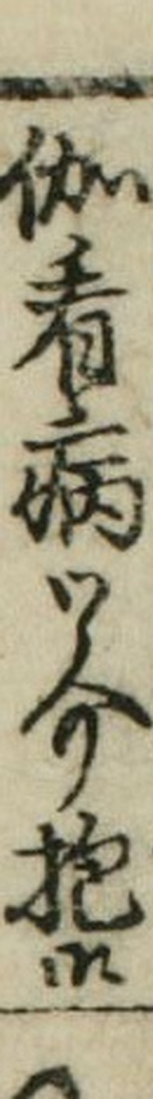伽看病御介抱御
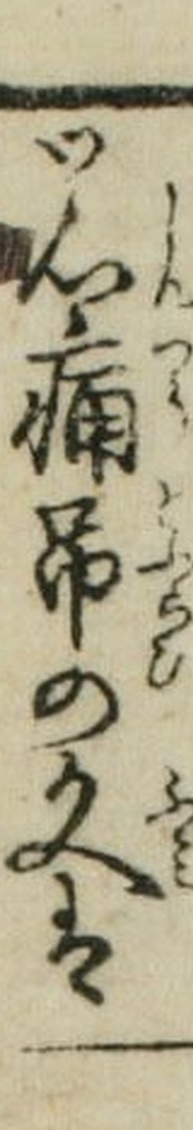御心痛弔の文は
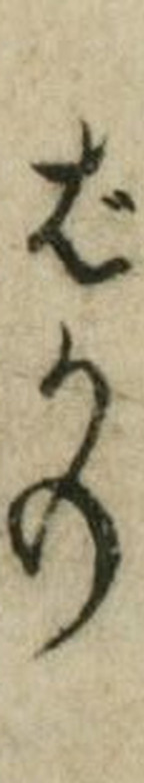ばかり
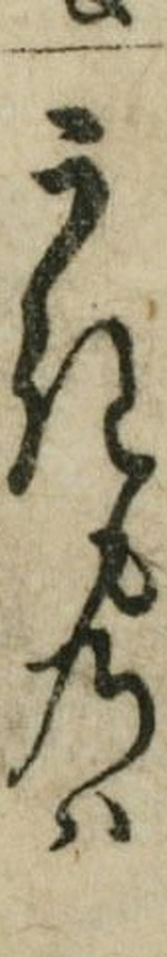うきものは
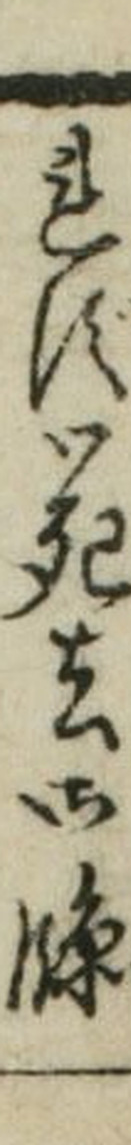れず御死去御臨
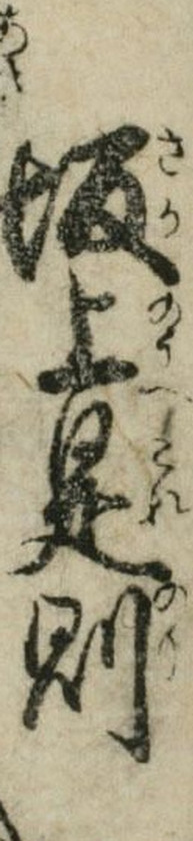坂上是則
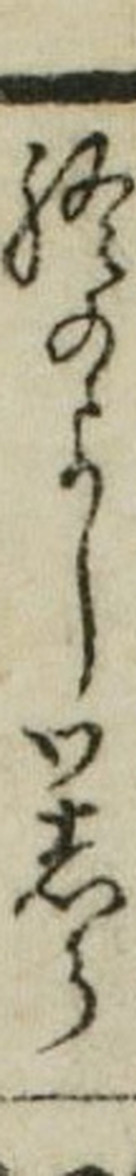終のよし御しら
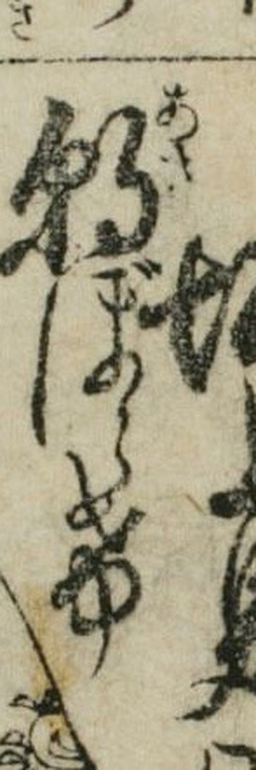朝ぼらけ
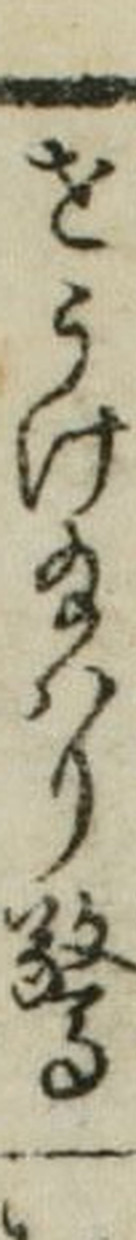せうけ給はり驚
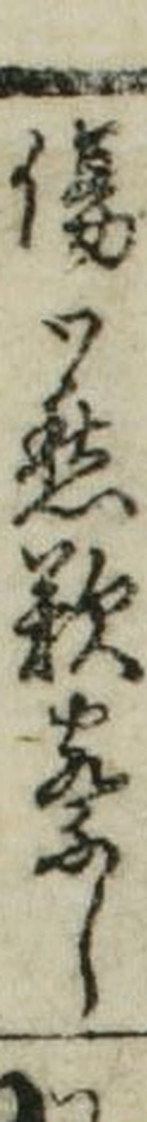傷御愁嘆察し
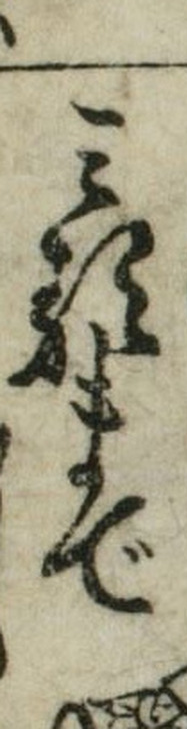みるまで
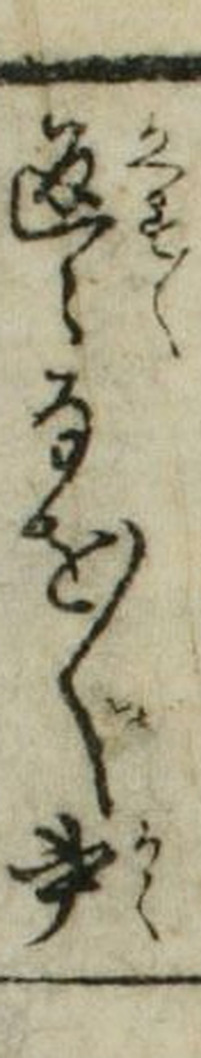返々なを〳〵書
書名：百人一首
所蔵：東京学芸大学教育コンテンツアーカイブ
